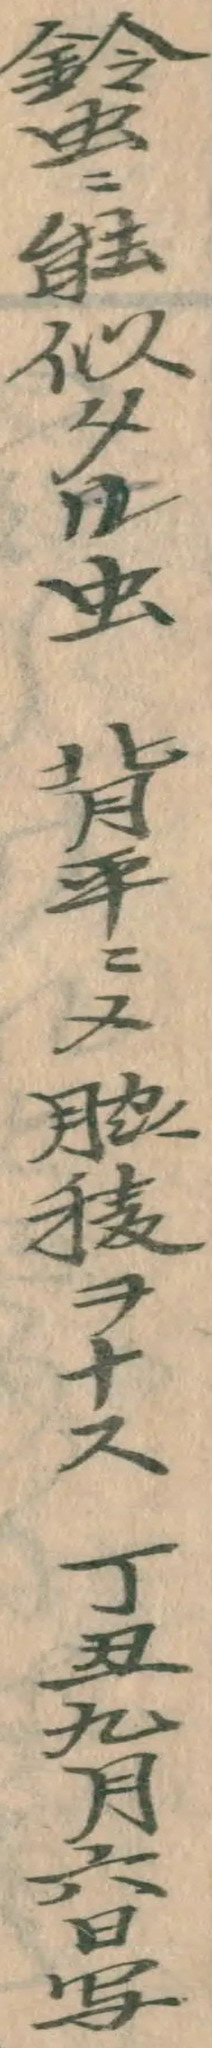鈴虫ニ能似タル虫背平ニシテ脇稜ヲナス丁丑九月六日写
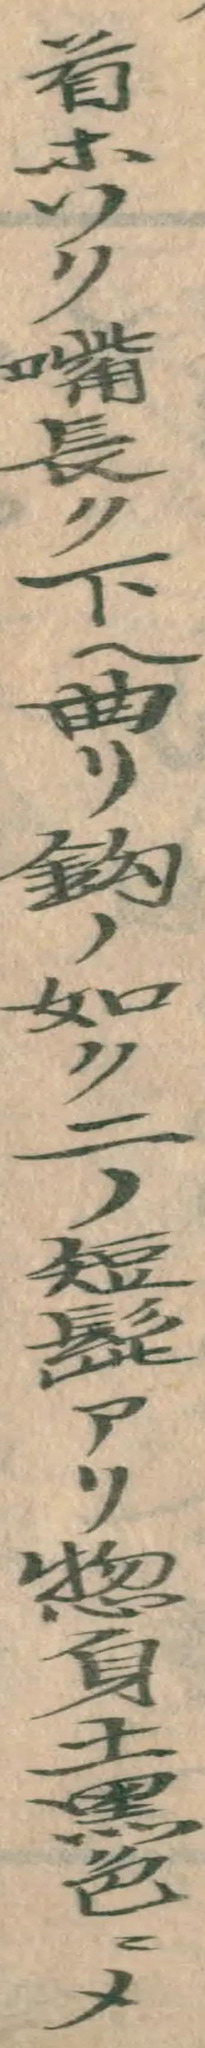首ホソク嘴長ク下ヘ曲リ鈎ノ如ク二ノ短髭アリ惣身土黒色ニシテ
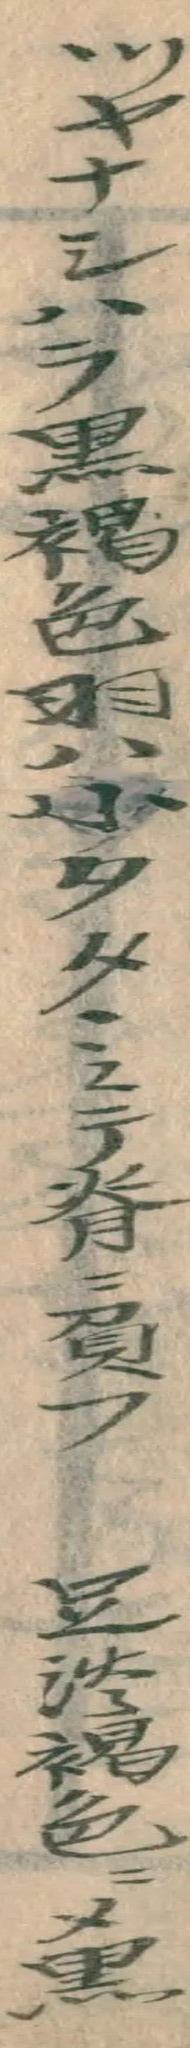ツヤナシハラ黒褐色羽ハ小クタヽミテ脊ニ負フ足淡褐色ニシテ黒
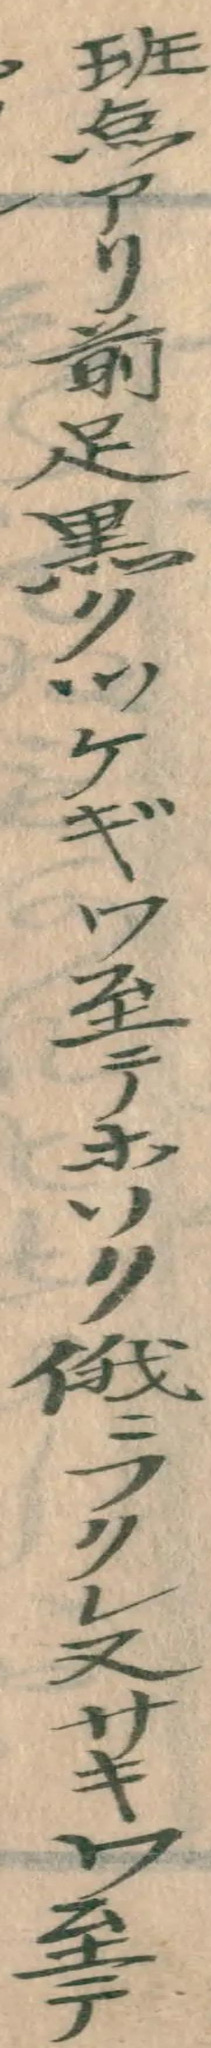班点アリ前足黒クツケギワ至テホソク俄ニフクレ又サキワ至テ
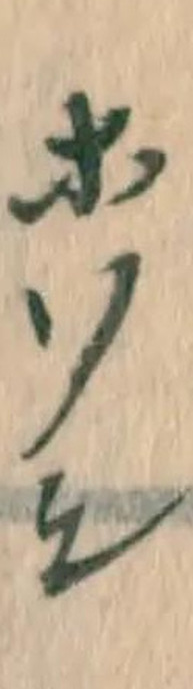ホソシ
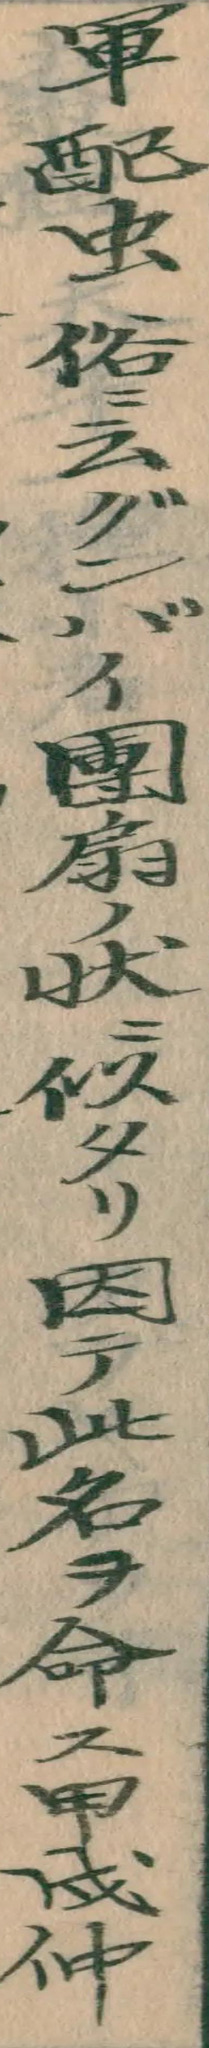軍配虫俗ニ云グンバイ團扇ノ状ニ似タリ因テ此名ヲ命ス甲戌仲
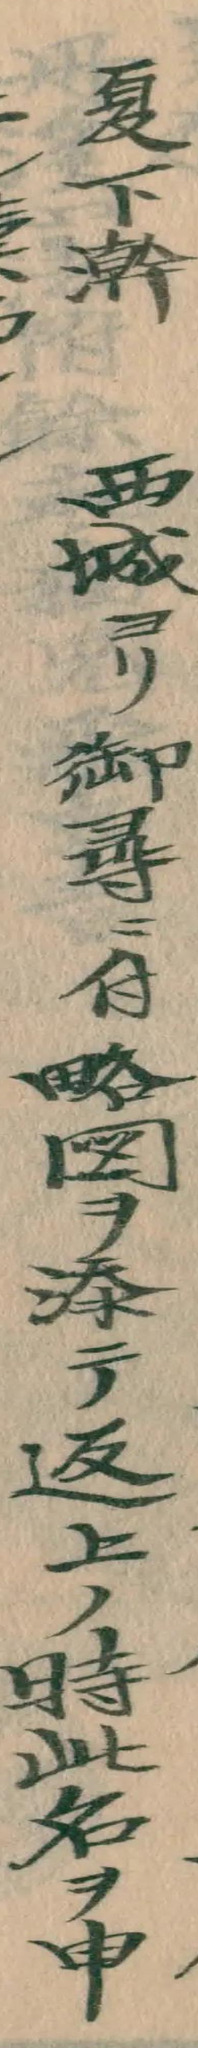夏下澣西城ヨリ御尋ニ付略図ヲ𣷹テ返上ノ時此名ヲ申
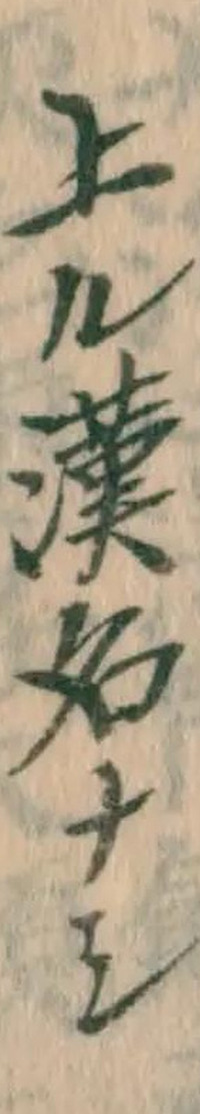上ル漢名ナシ
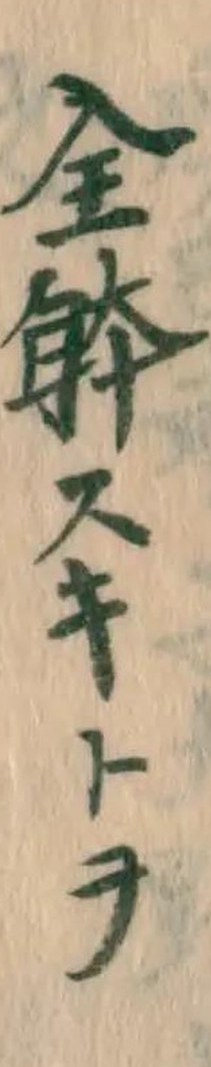全躰スキトヲ
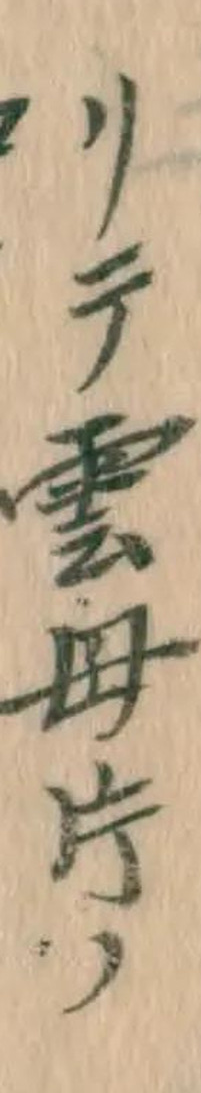リテ雲母片ノ
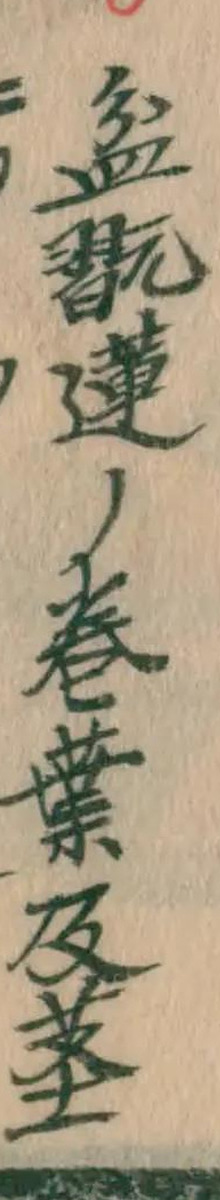◦盆翫蓮ノ巻葉及茎
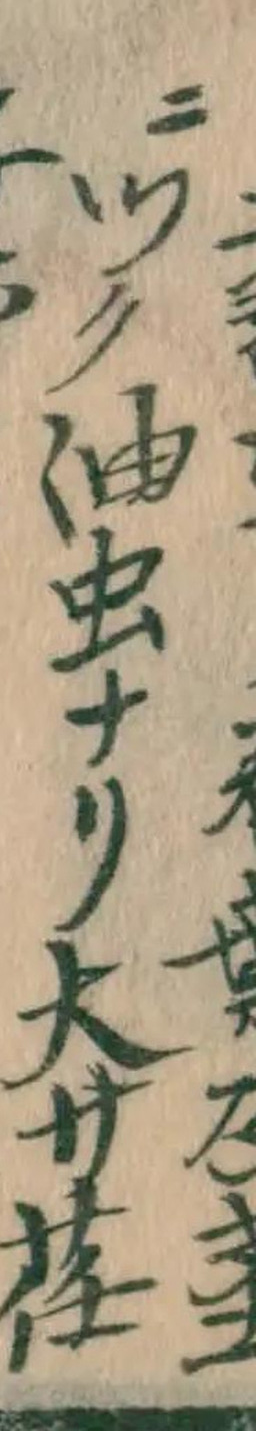ニツク油虫ナリ大サ荏
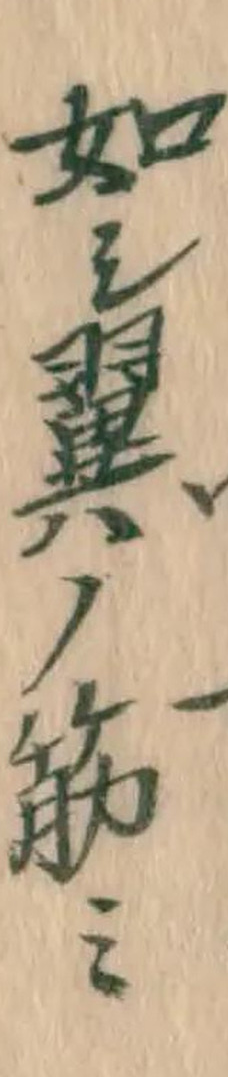如シ翼ハ筋ミ
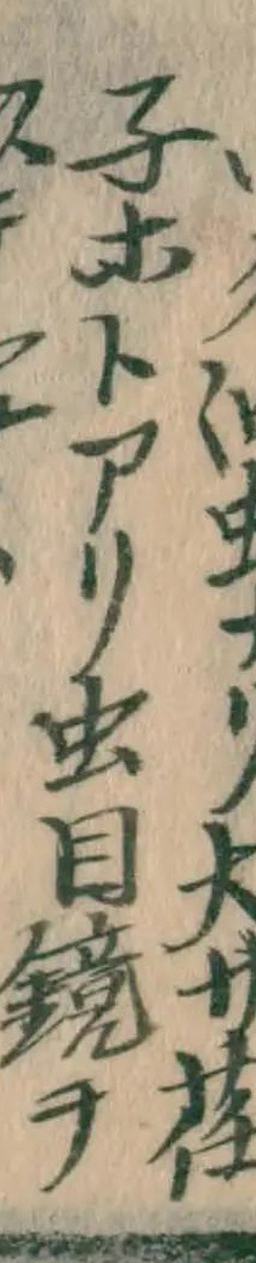子ホトアリ虫目鏡ヲ
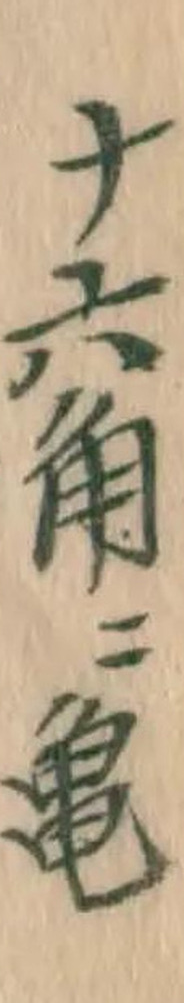ナ六角ニ亀
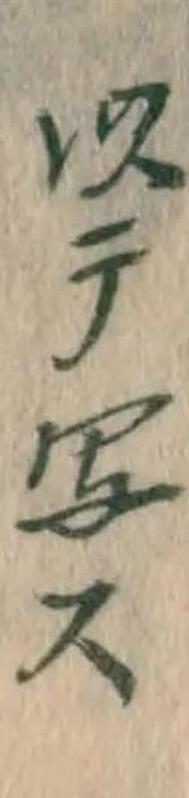以テ写ス
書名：千蟲譜 3巻. [1]
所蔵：国立国会図書館 National Diet Library, JAPAN
